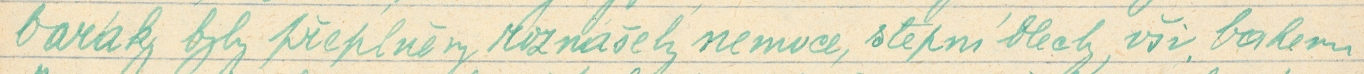baráky byly přeplněny roznášely nemoce, stepní blechy, vši, bahenní
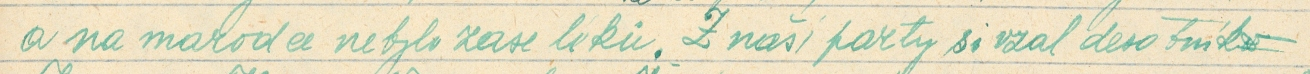a na marodce nebylo zase léků. Z naší party si vzal desatník
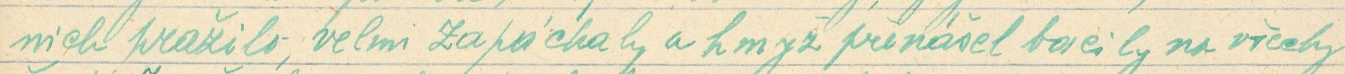nich pražilo, velmi zapáchaly a hmyz přenášel bacily na všechy
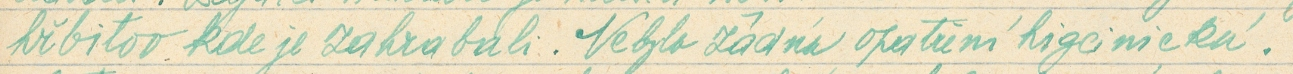hřbitov kde je zahrabali. Nebyla žádná opatření higeinická.
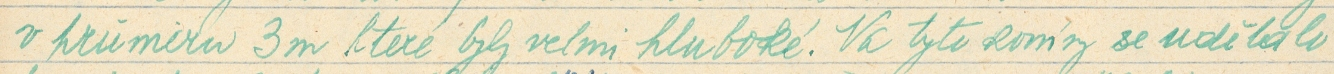v průměru 3 m které byly velmi hluboké. Na tyto komíny se udělalo
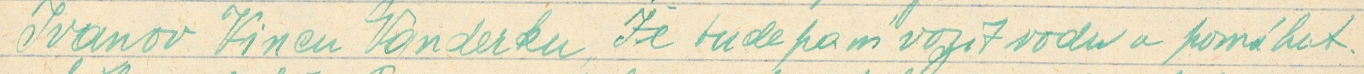Ivanov Vincu Vanderku, že bude paní vozit vodu a pomáhat.
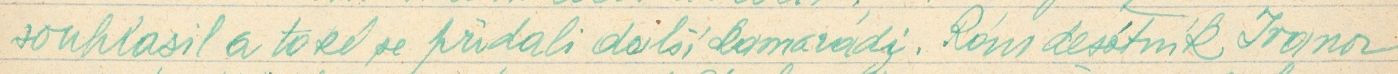souhlasil a také se přidali další kamarádi. Ráno desátník Ivanov
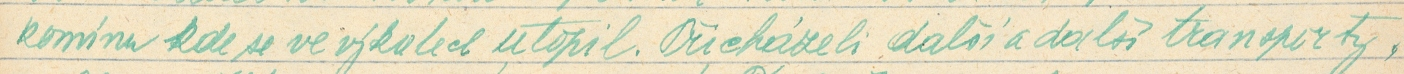komínu kde se ve výkalech utopil. Přicházeli další a další transporty,
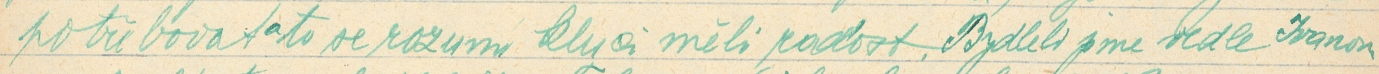potřebovat a to se rozumí kluci měli radost. Bydleli jsme vedle Ivanova
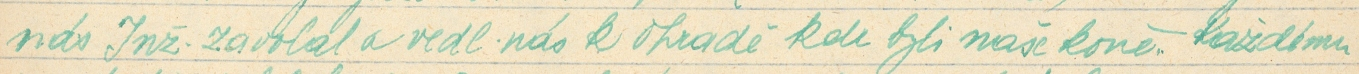nás Inž. zavolal a vedl nás k ohradě kde byli naše koně. Každému
